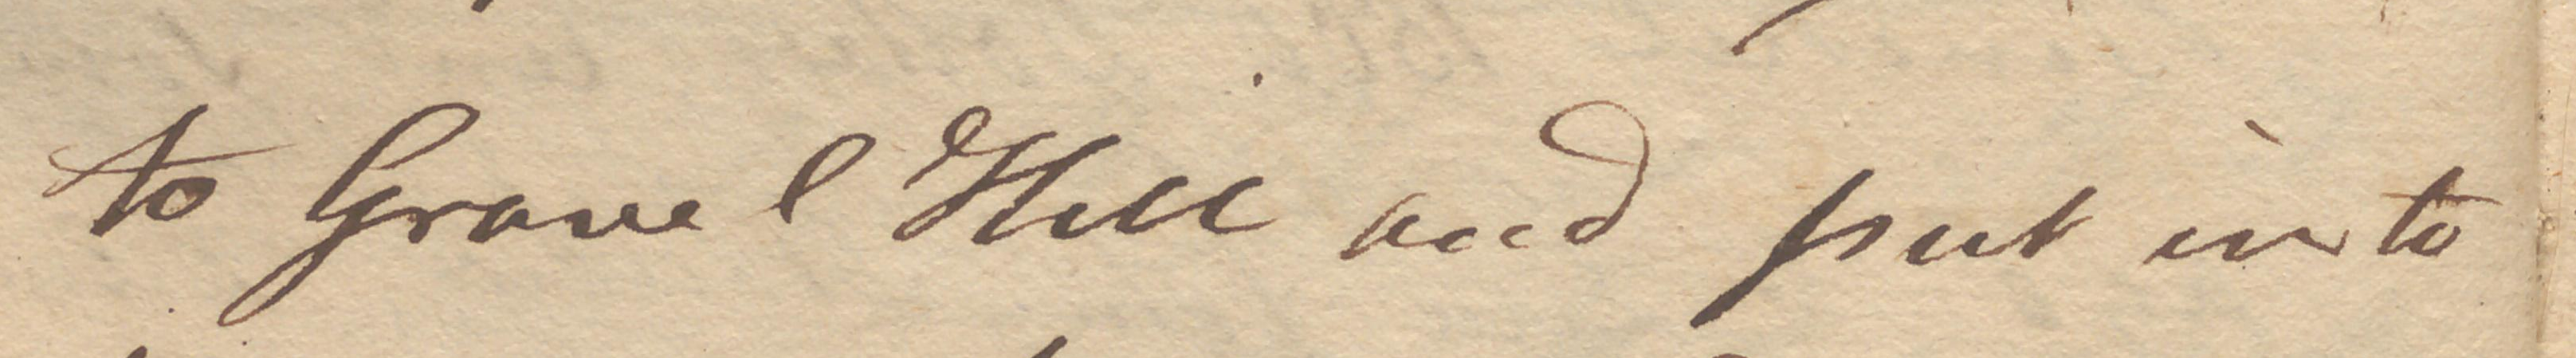to Gravel Hill and put in to
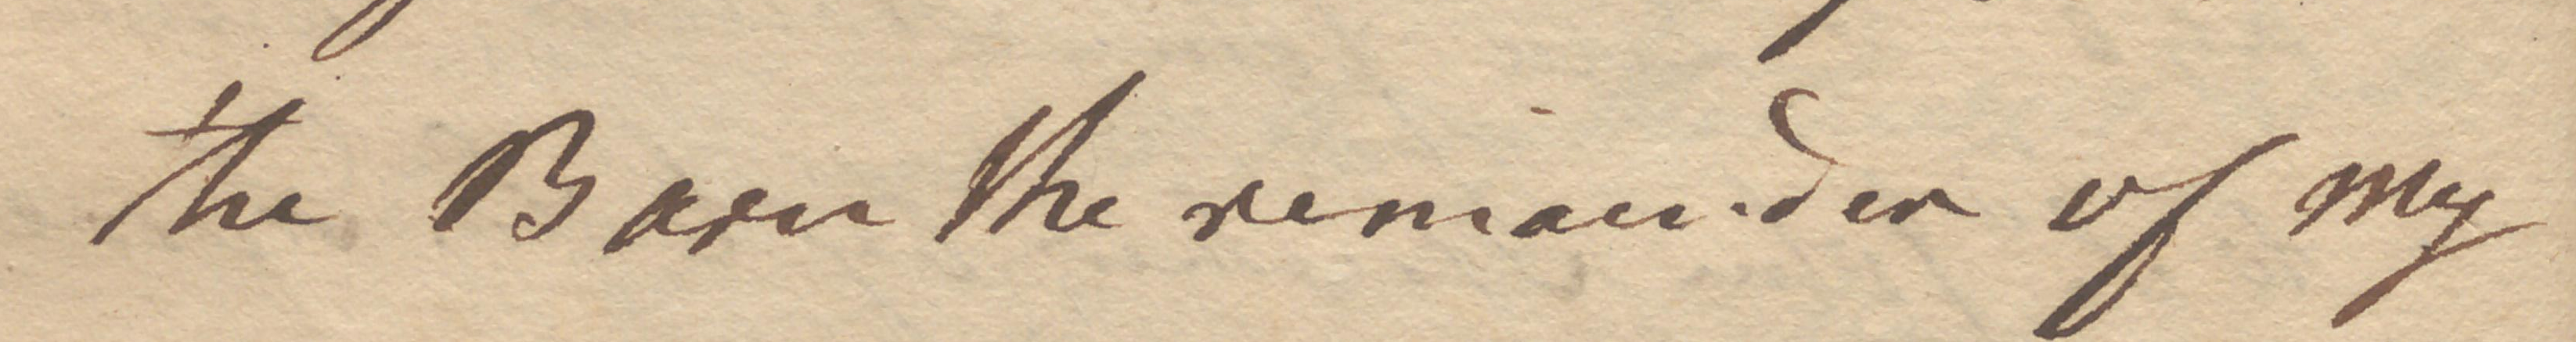the Barn the remainder of my
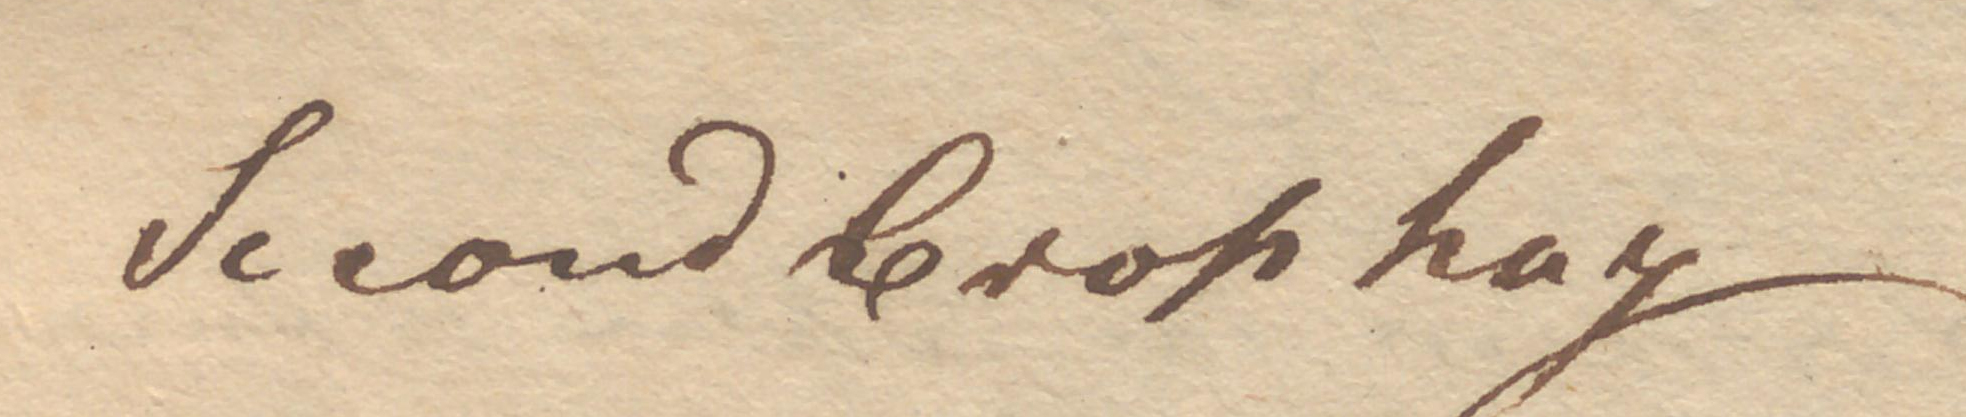Second Crop hay
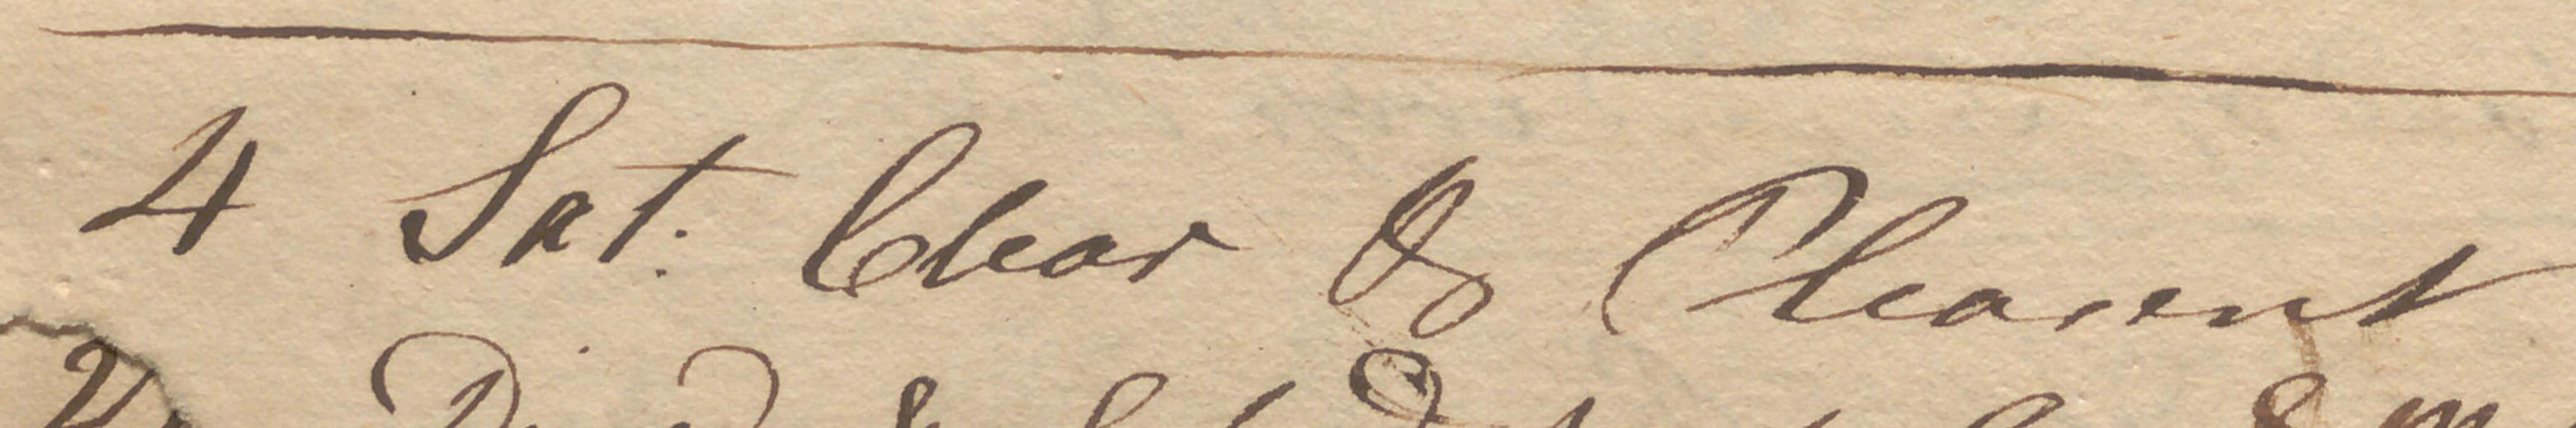4 Sat. Clear & Pleasent
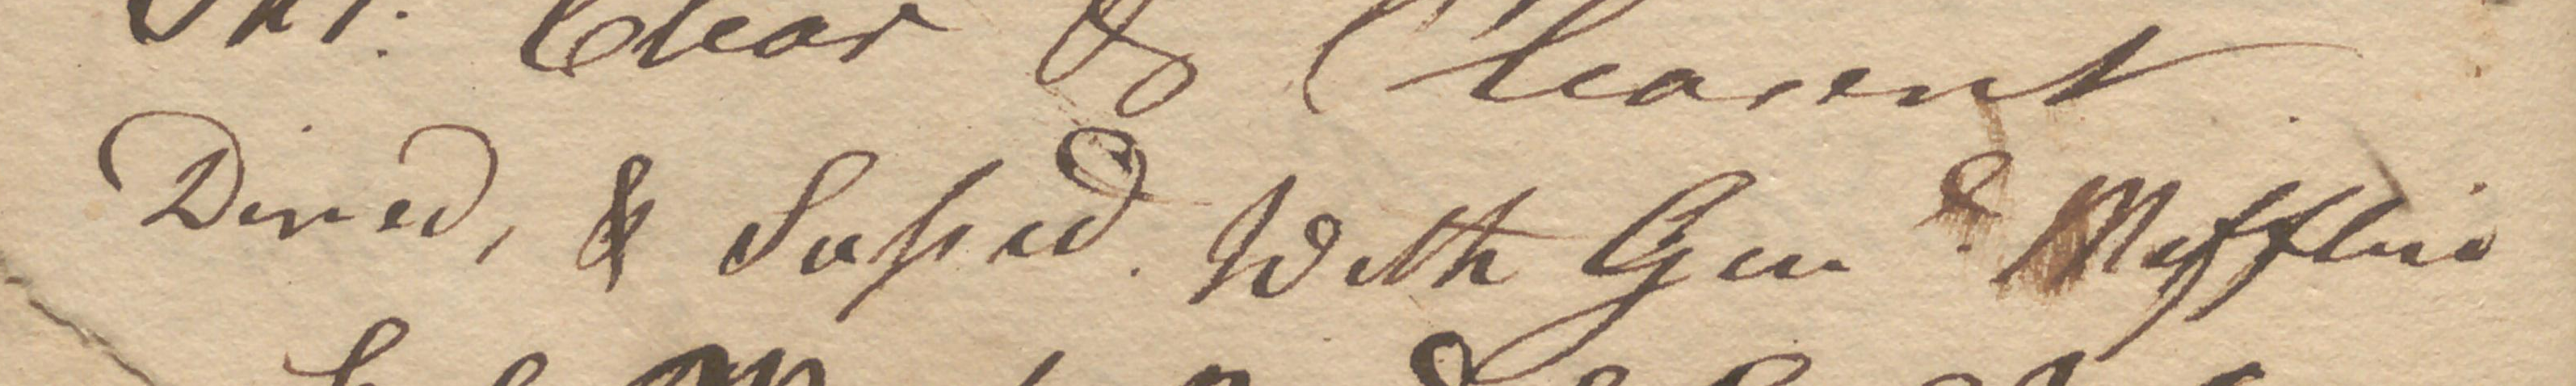Dined, & Soped. With Gen^l. Mafflin
